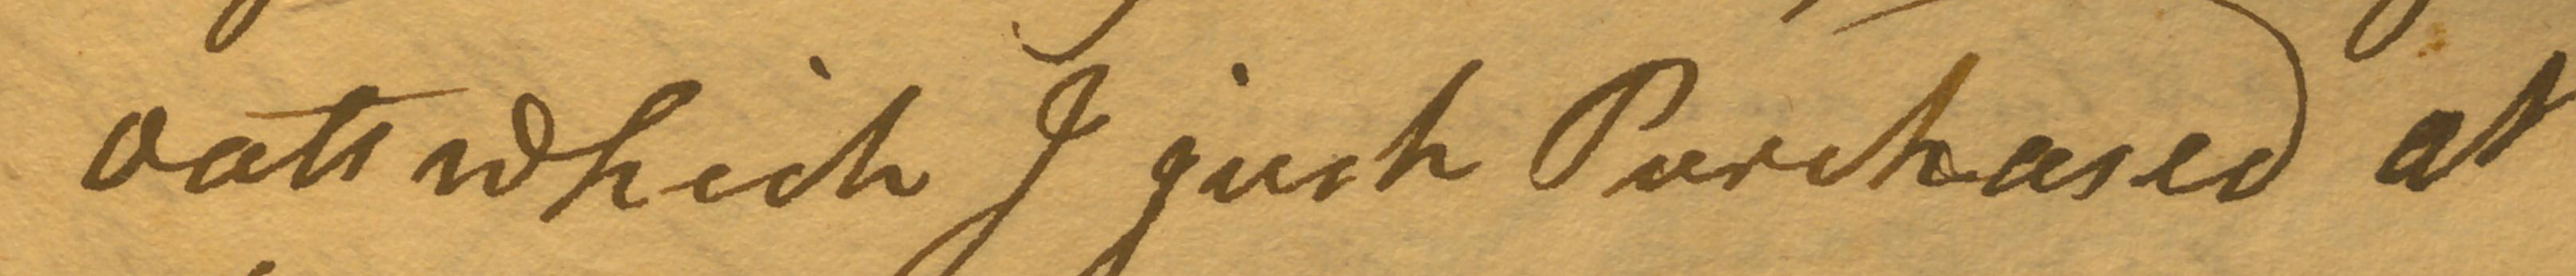oats which I just Purchased at
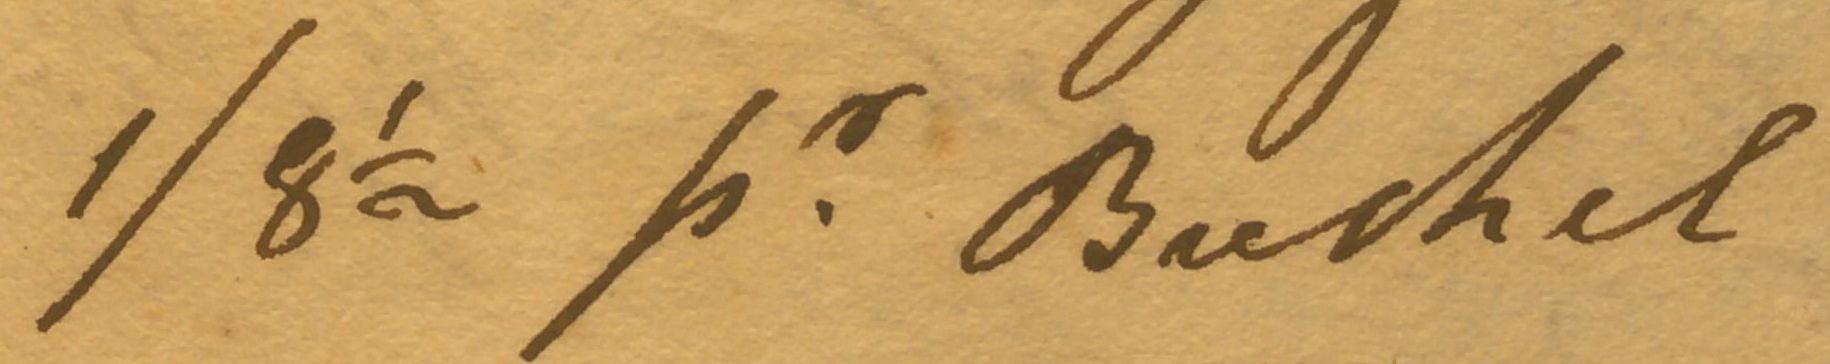1s8 1/2 p^r. Bushel
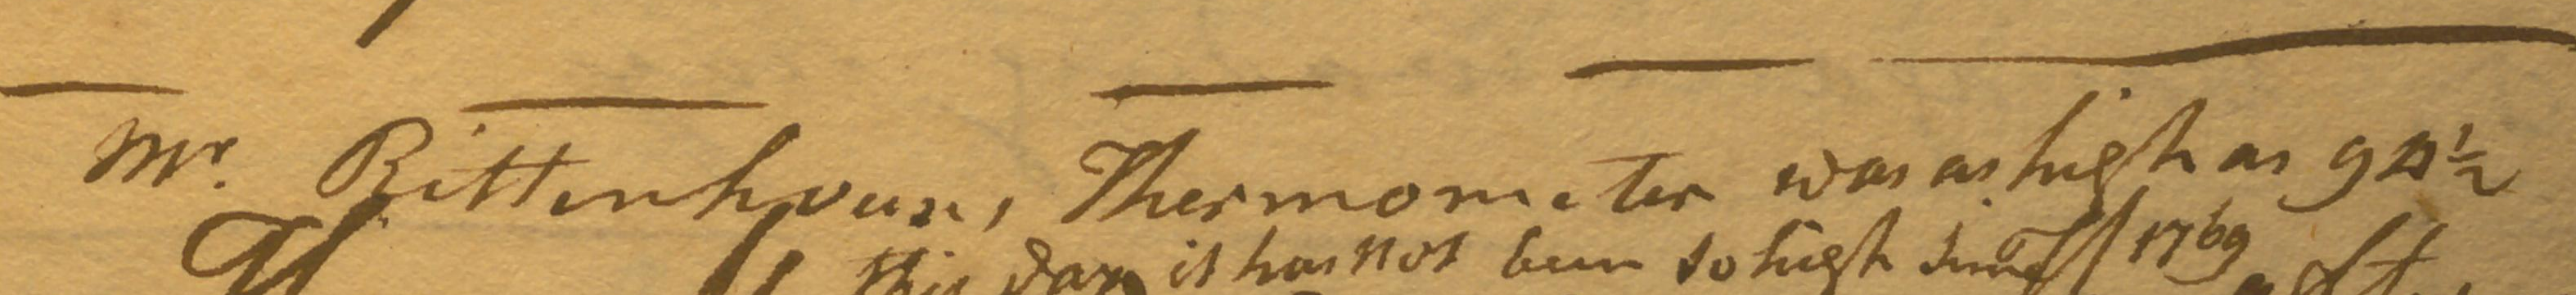M^r. Rittinhouses Thermometer was as high as 94 1/2
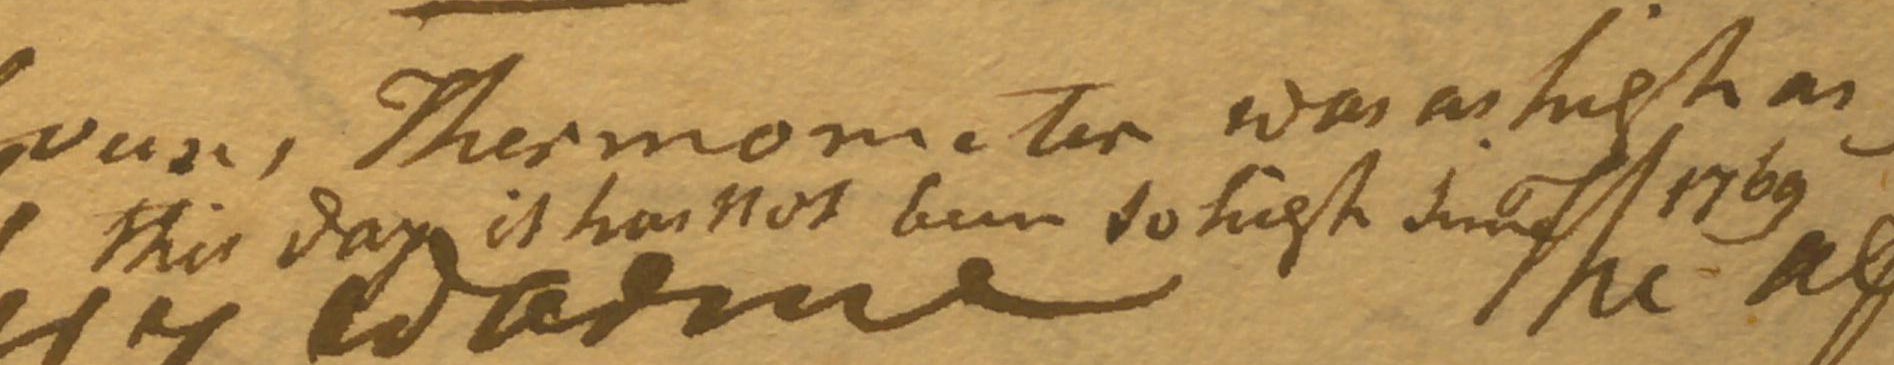this day, it has not been so high sea since 1769
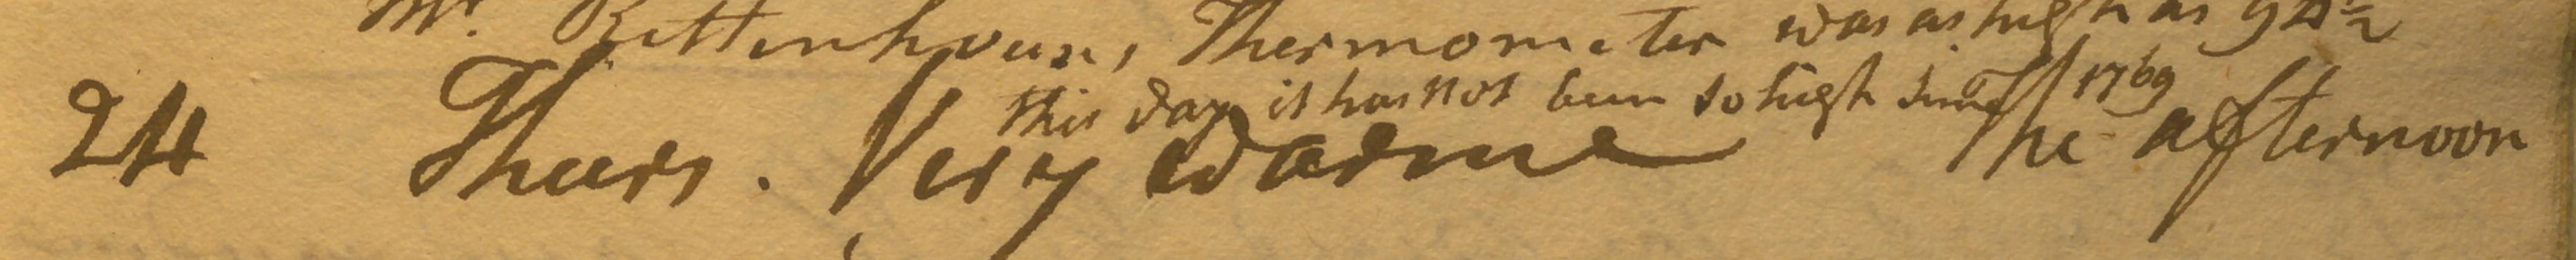24 Thurs. Very Warme The afternoon
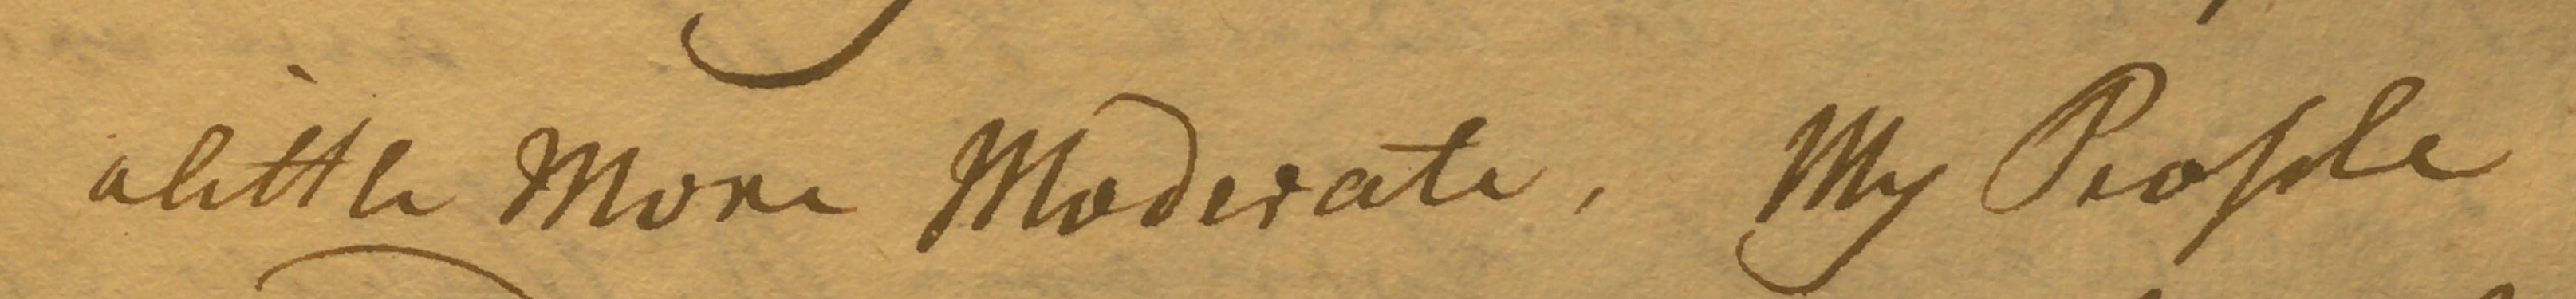a little More Moderate. My People
